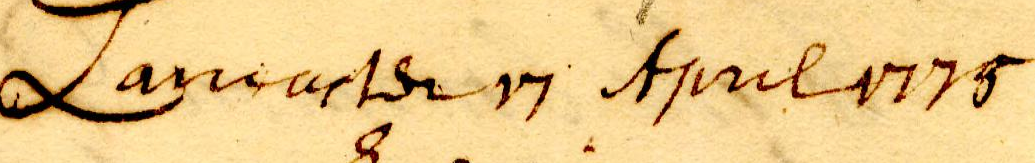Lancaster 17 April 1775
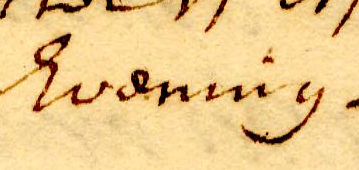Evening
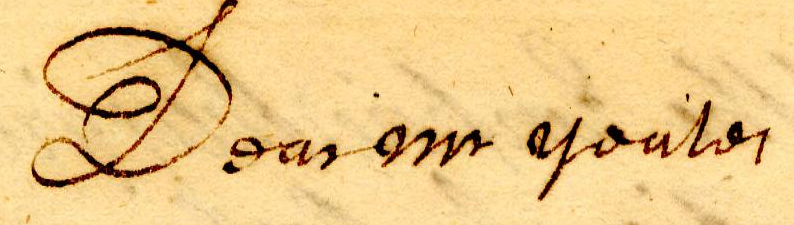Dear M^r Yeates
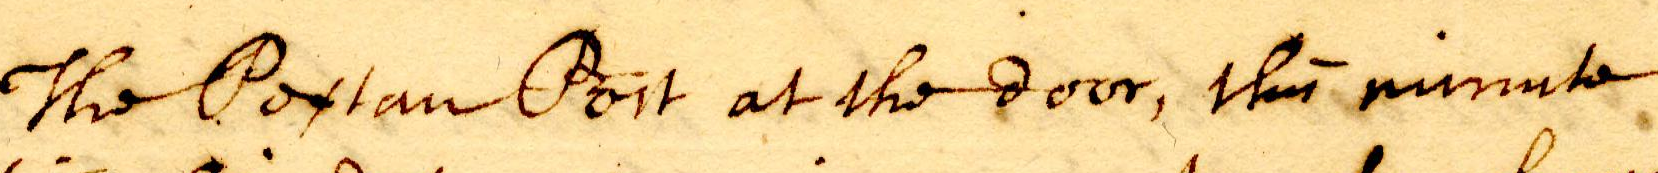The Poxtan Post at the door, this minute
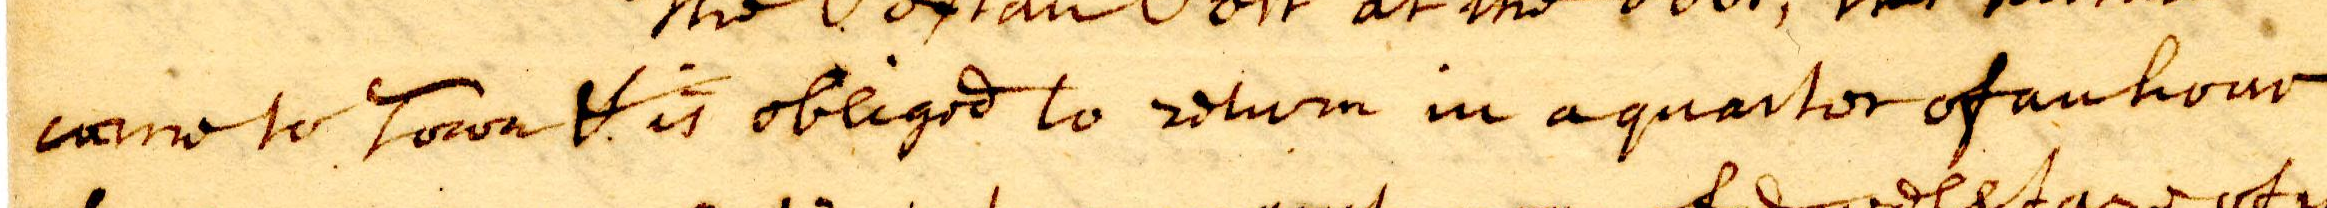came to Town & is obliged to whom in a quarter of an hour
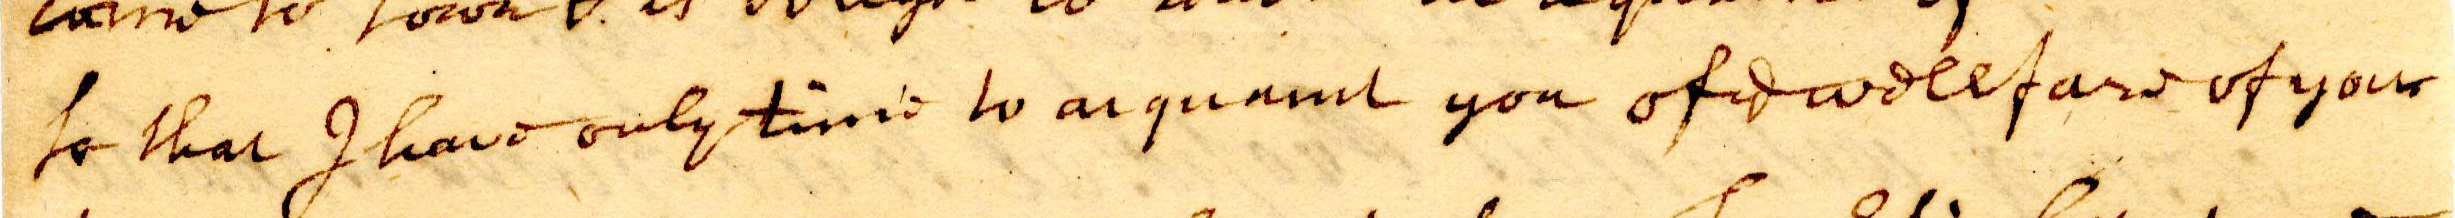so that I leave only time to acquaint you of wellfare of your
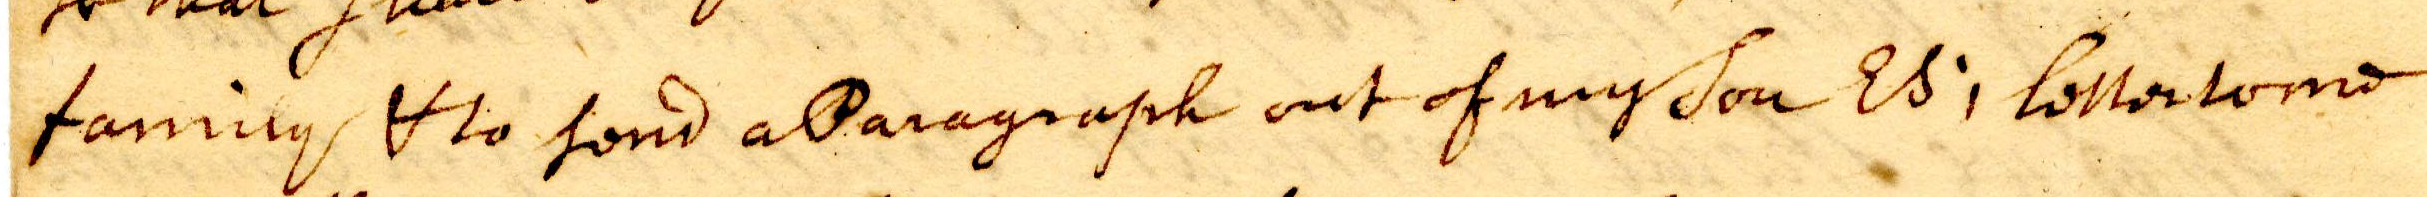family & to send a Paragraph out of my Son ES: better some
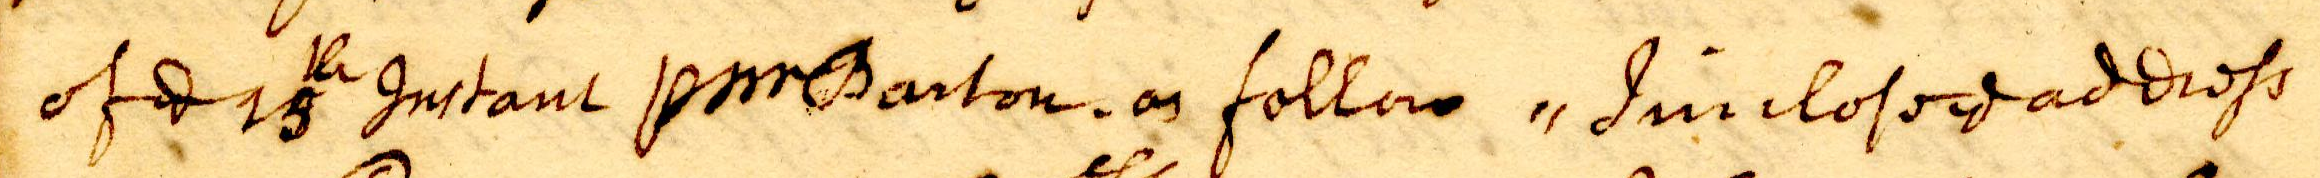of & 15^th Instant per M^r Barton. as follows "Inclosed address
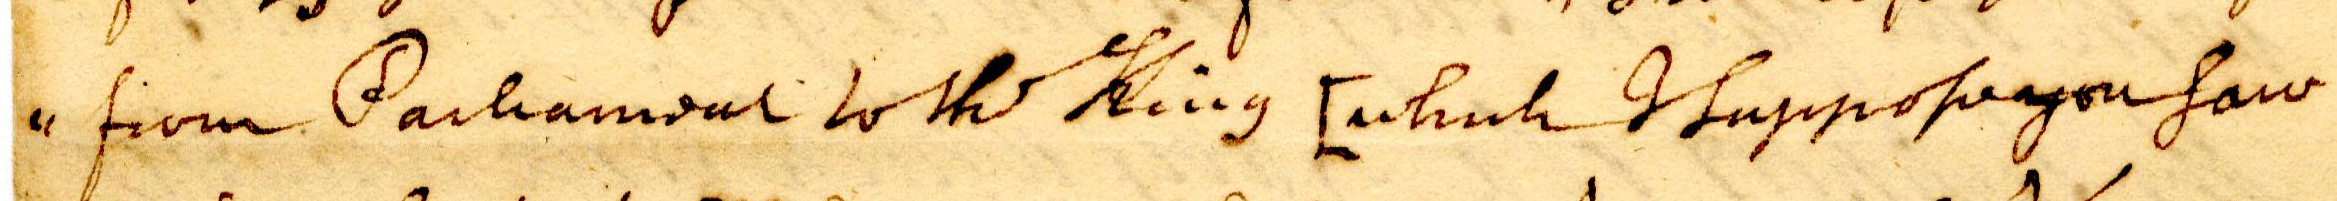"from Parliament to the King (which I Suppose you saw
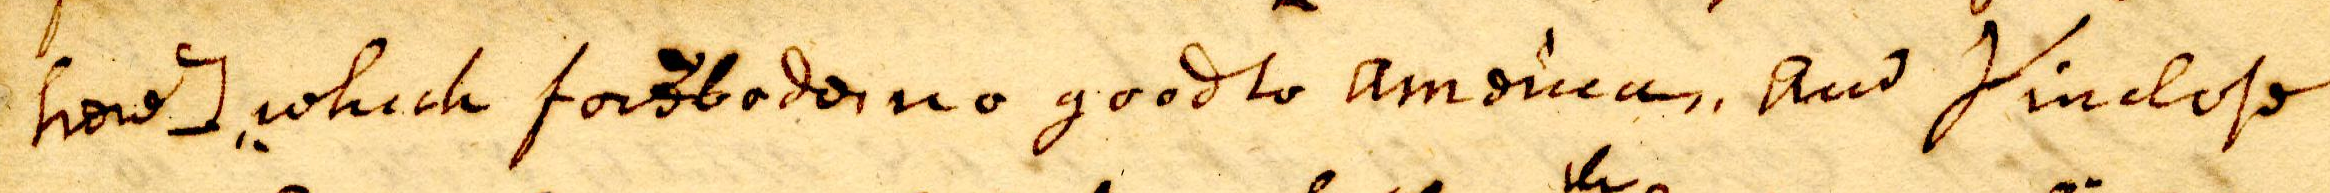how]" which forbade no good to America" and I inclose
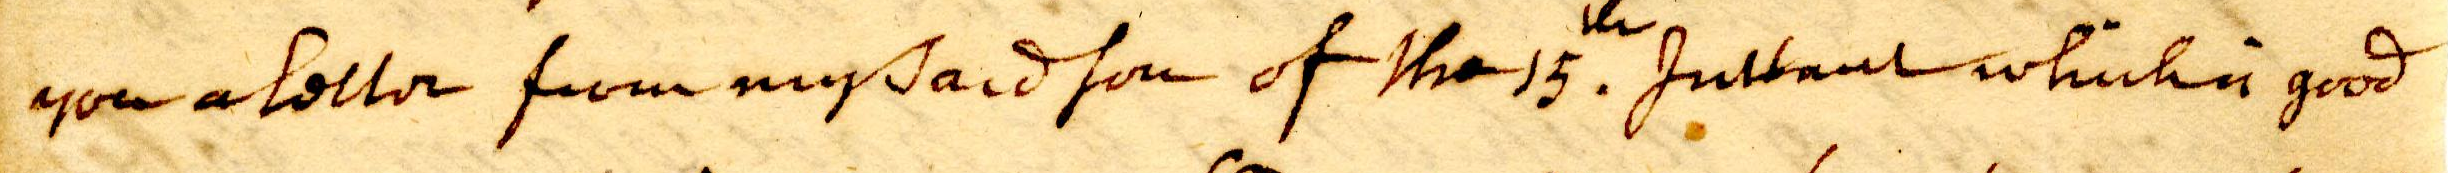you a letter from my said son of the 15^th. Instant which is good
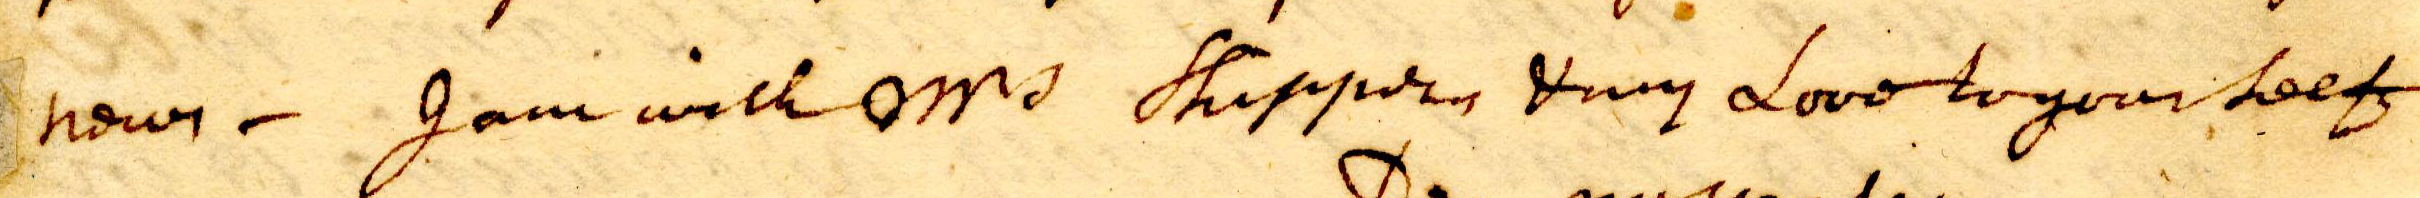news. I am with M^rs Shippens & my Love to your heef
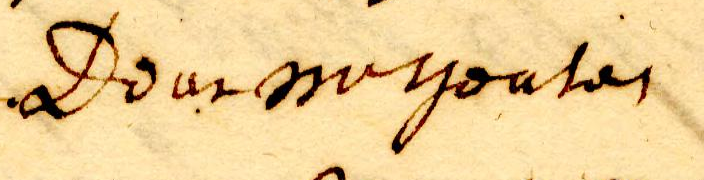Dear Mr^rs Yeates
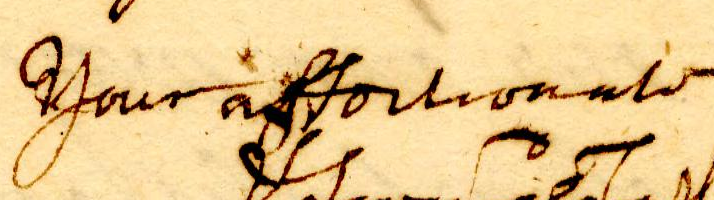Your affectionate
